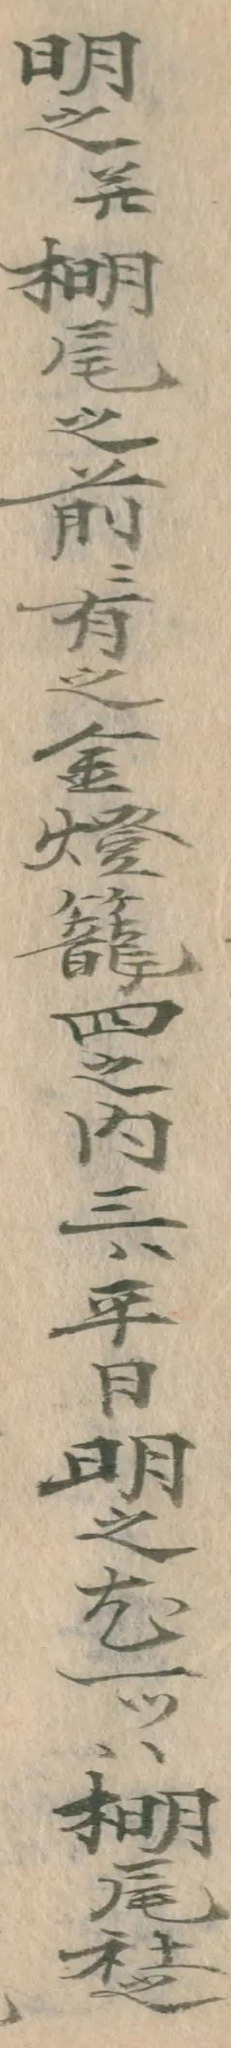明之并棚尾之前ニ有之金燈籠四之内三ハ平日明之尤一ツハ棚尾社之
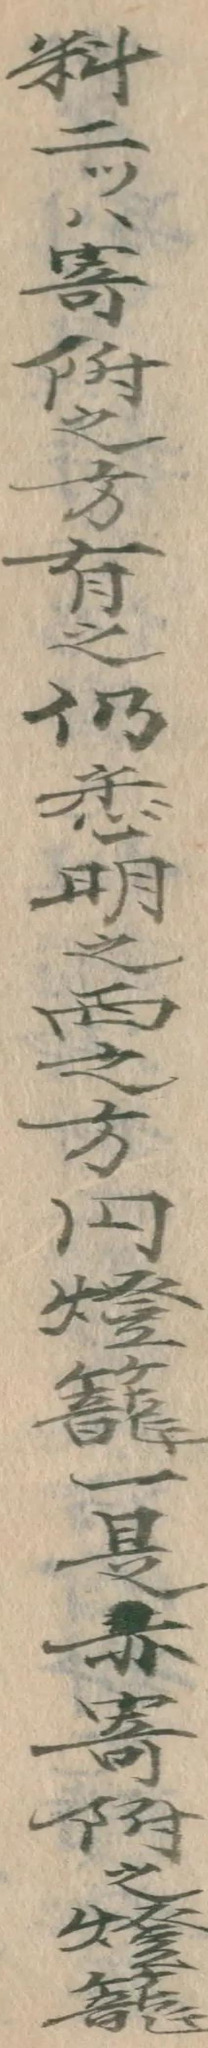料二ツハ寄附之方有之仍悉明之西之方円燈籠一是赤寄附之燈籠
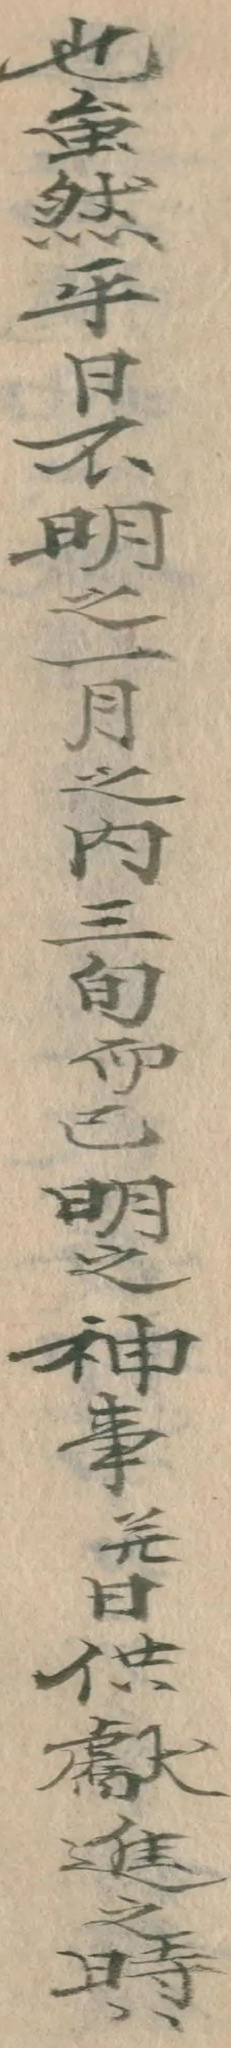也雖然平日不明之一月之内三旬而已明之神事并日供献進之時ハ
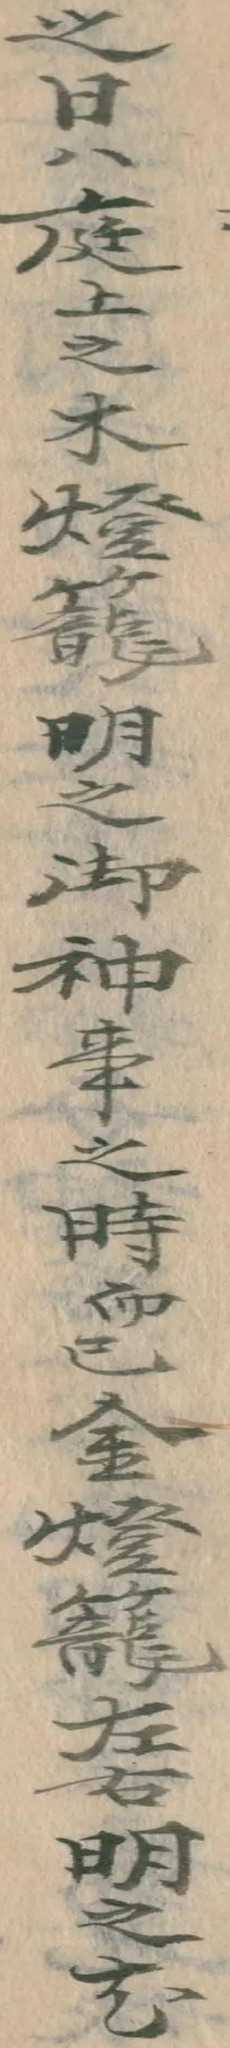之日ハ庭上之木燈籠明之御神事之時而已金燈籠左右明之尤
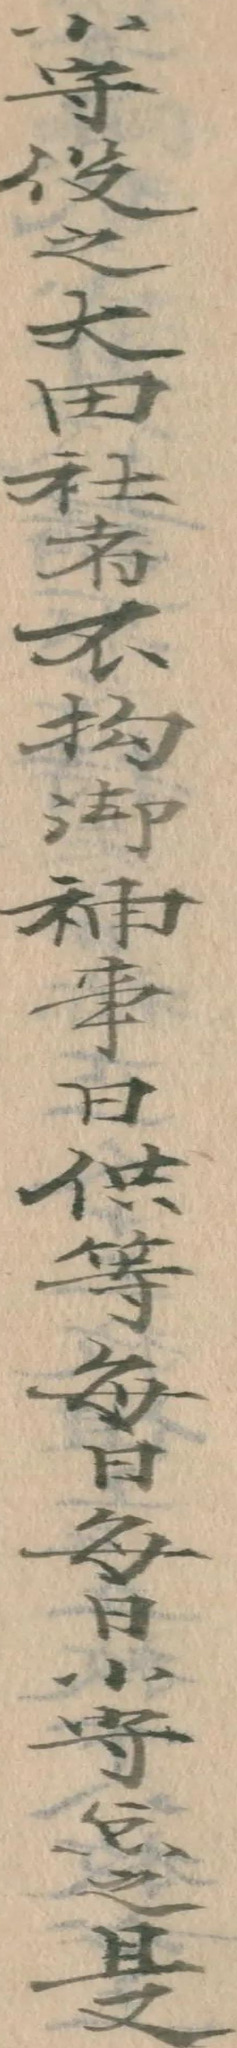小守役之大田社者不拘御神事日供等毎日毎日小守点之且又
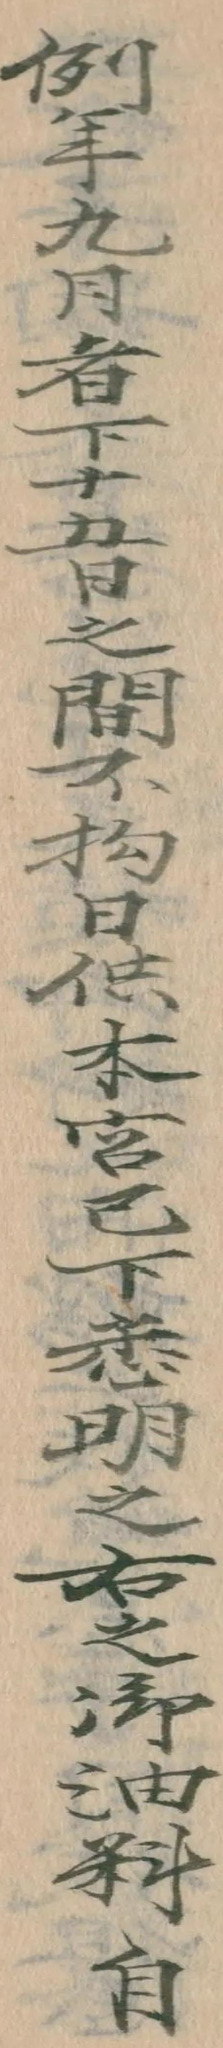例年九月者下十五日之間不拘日供本宮已下悉明之右之御油料自
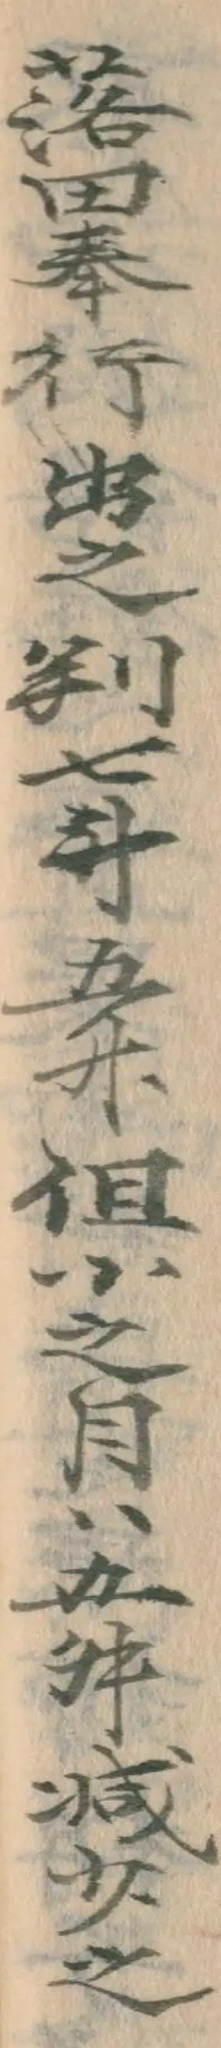落田奉行出之判七斗五升但小之月ハ五升減少之
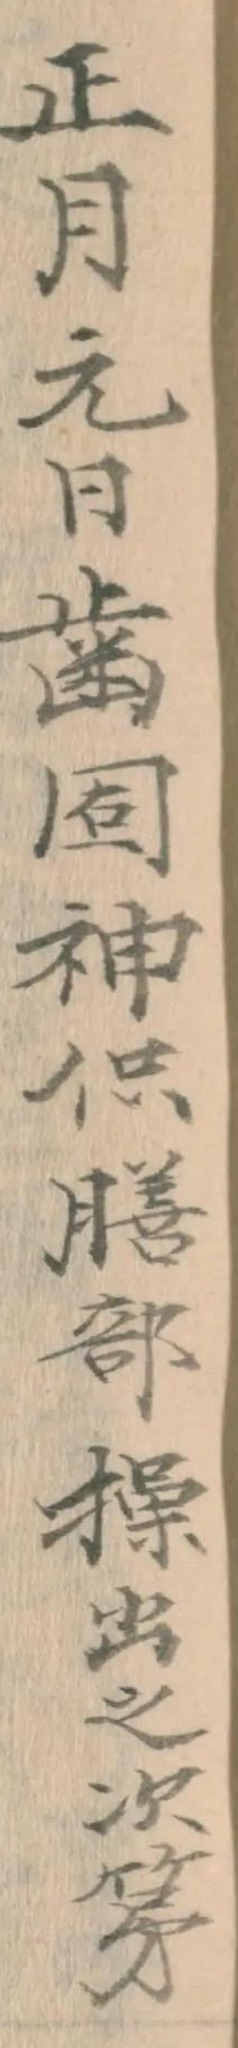正月元日歯固神供膳部操出之次第
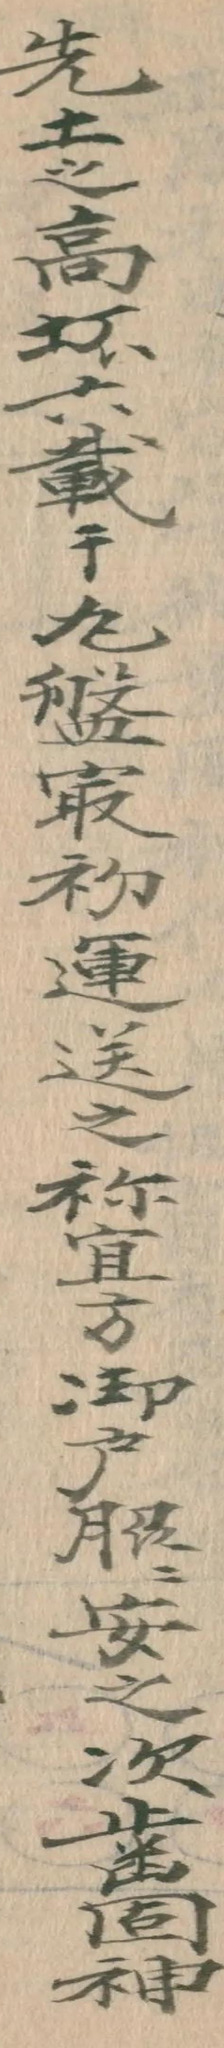先土之高坏六載于丸盤最初運送之祢宜方御戸脇ニ安之次歯固神
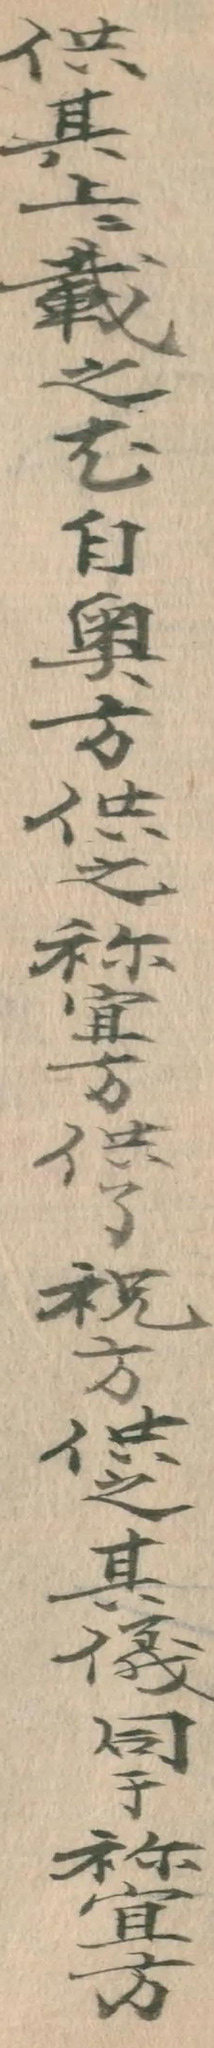供其上ニ載之尤自奥方供之祢宜方供了祝方供之其儀同于祢宜方

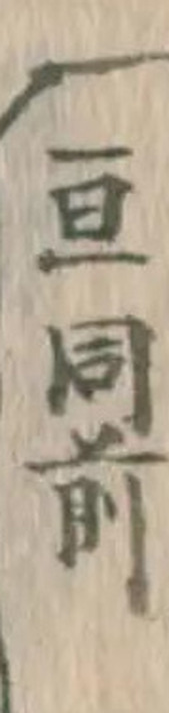亘同前
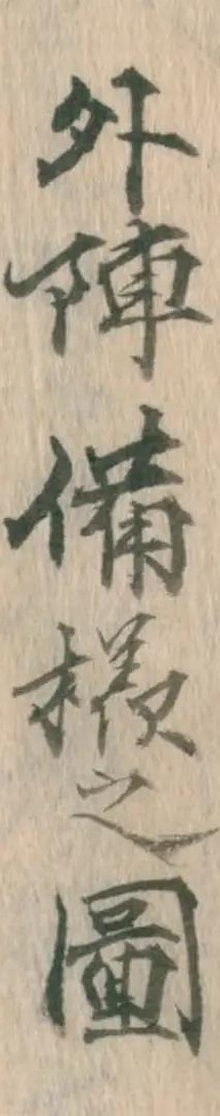外陣備様之図
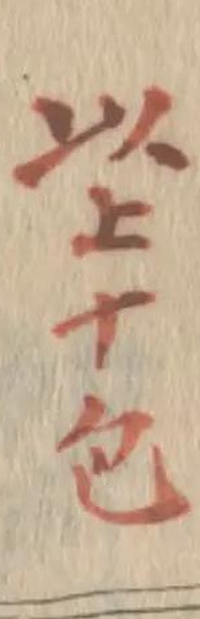以上十包

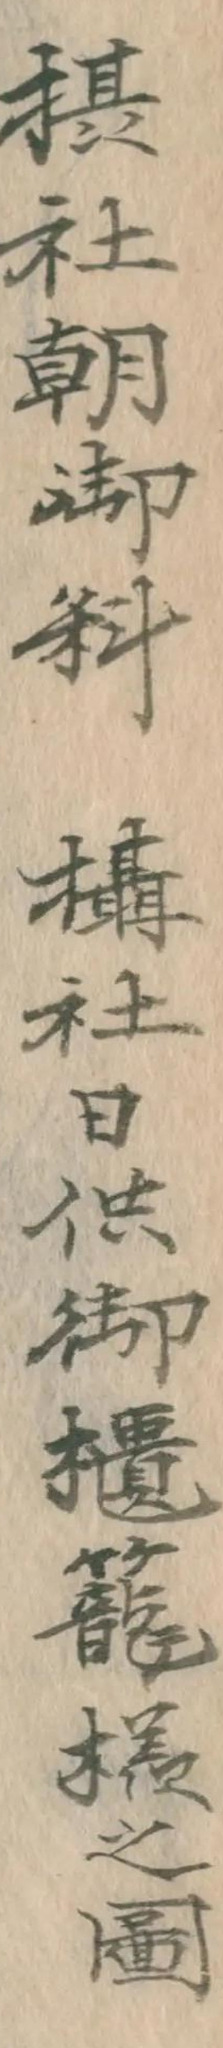摂社朝御料摂社日供御櫃籠様之図
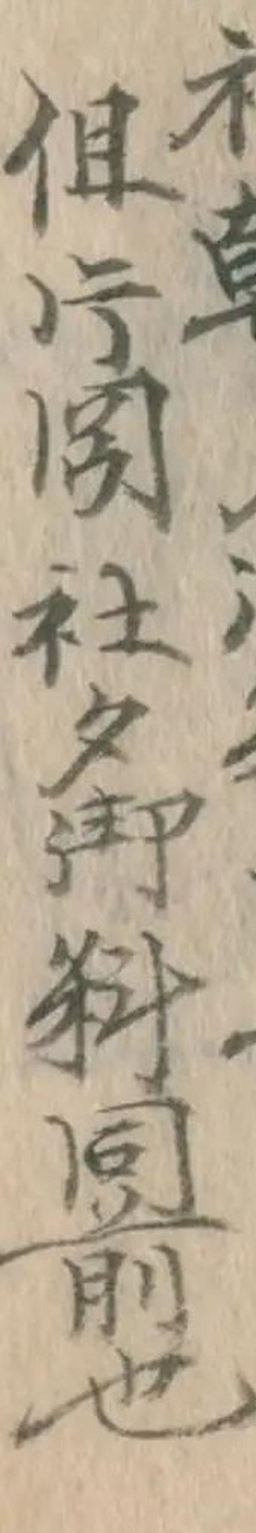但片岡社夕御料同前也
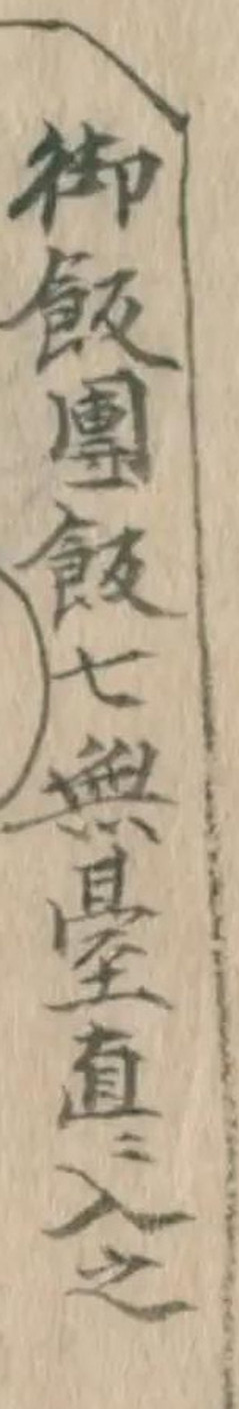御飯団飯七無台直ニ入之
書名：賀茂社記録. 第9冊
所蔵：国立国会図書館 National Diet Library, JAPAN
